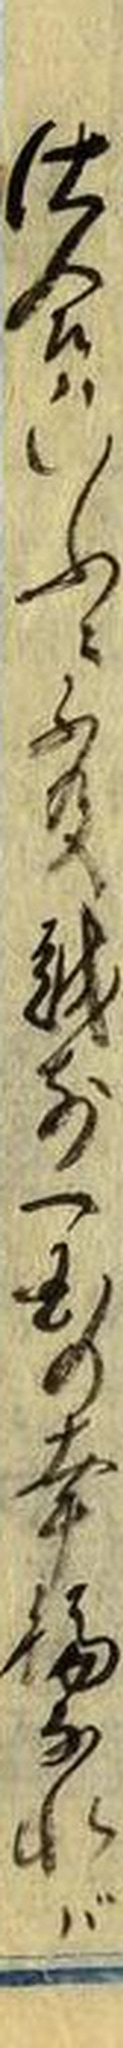仕合はいふに不及越前一国の幸福なれば
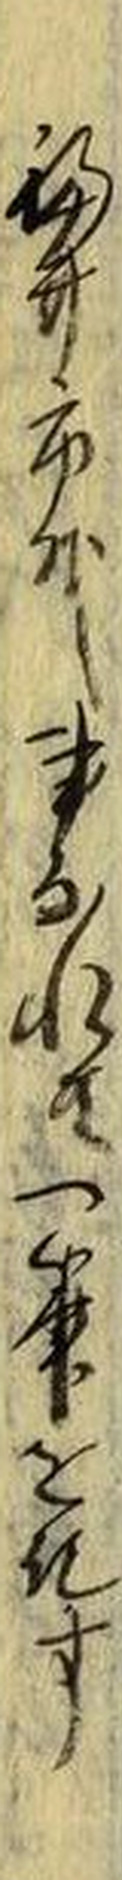福井市外之事なれ共一筆を記す。
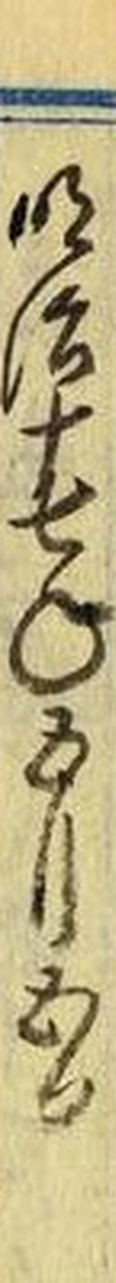明治十七年五月五日
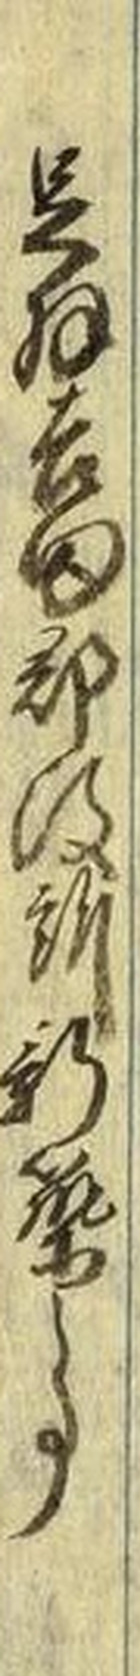足羽吉田郡役所新築之事
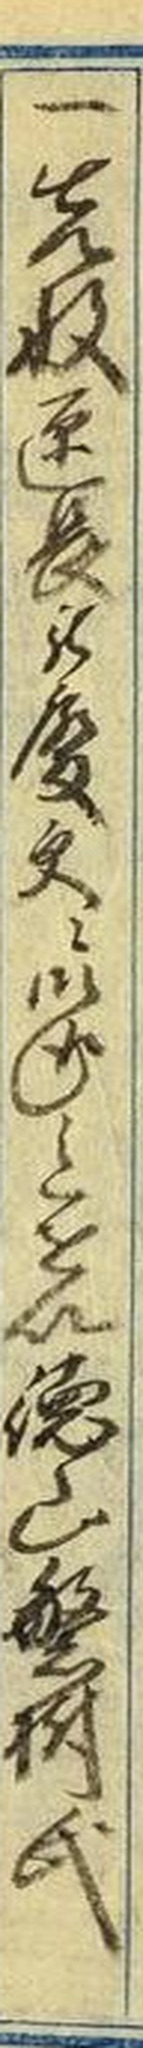一先般区長被廃更に御趣意を以徳山茂樹氏
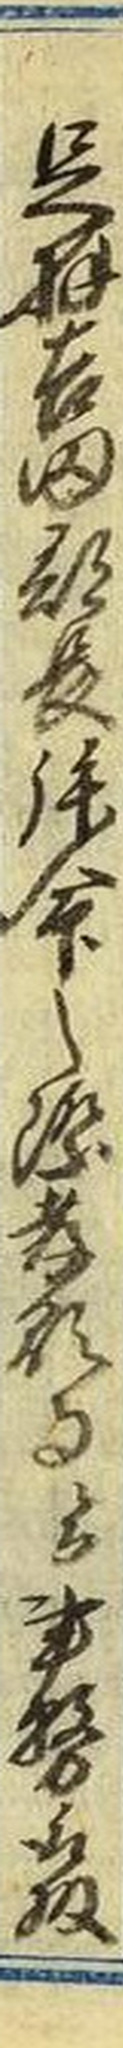足羽吉田郡長拝命之際孝顕寺に而事務取扱
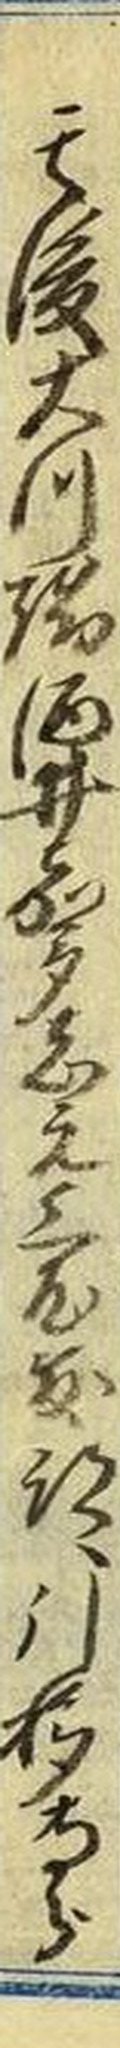其後大川端酒井嘉多志元上屋敷跡へ引移専ら
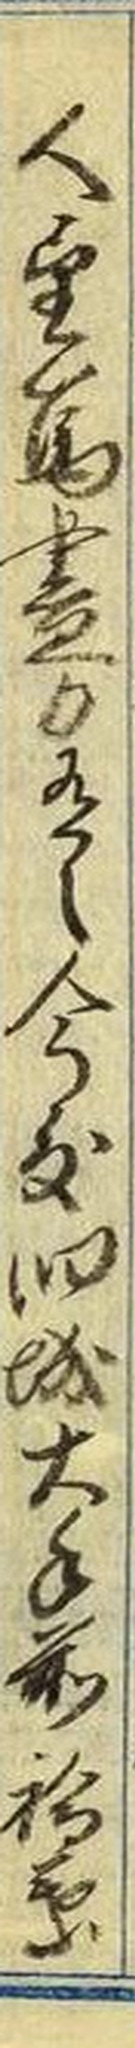人望篤尽力有之今度旧城大手前檜葉
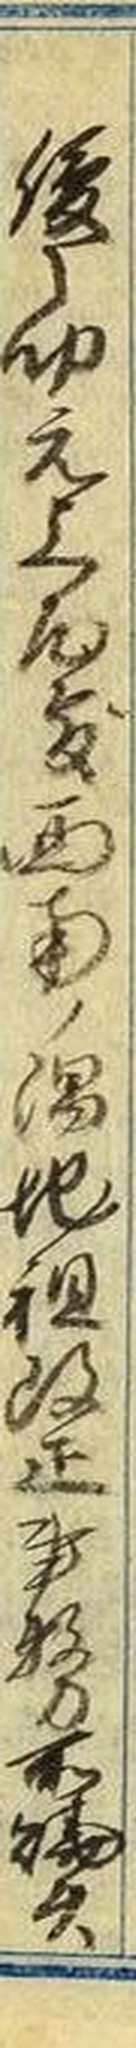優之助元上屋敷西南の隅地租改正事務所焼失
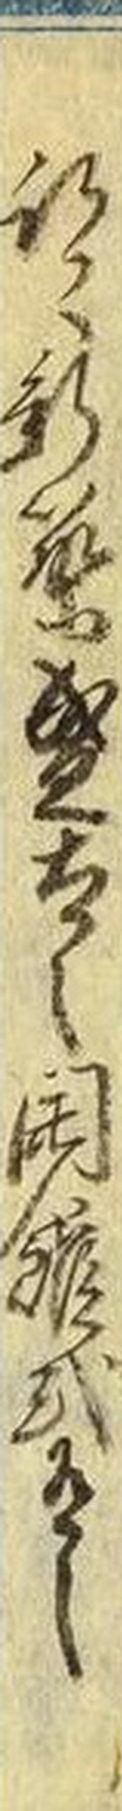跡へ新築盛太之開館式有之
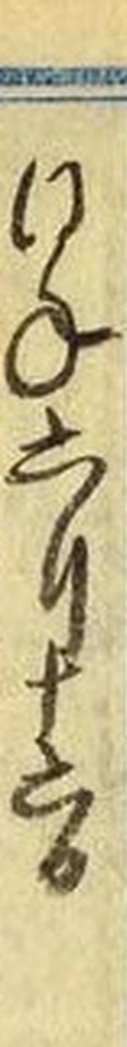同年六月十六日
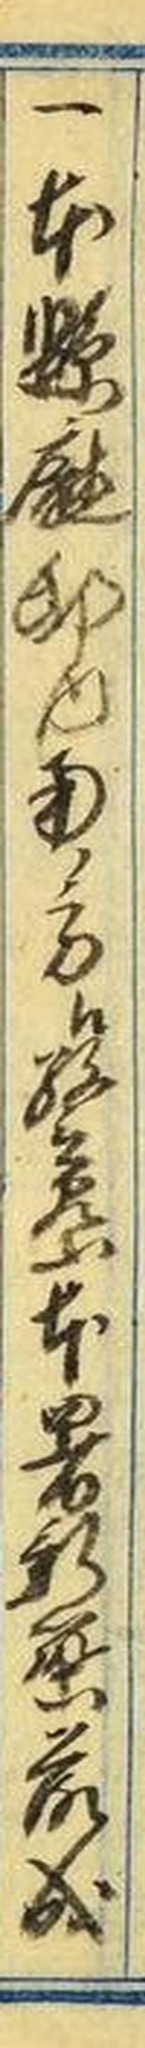一本県庁邸内南ノ方え警察本署新築落成

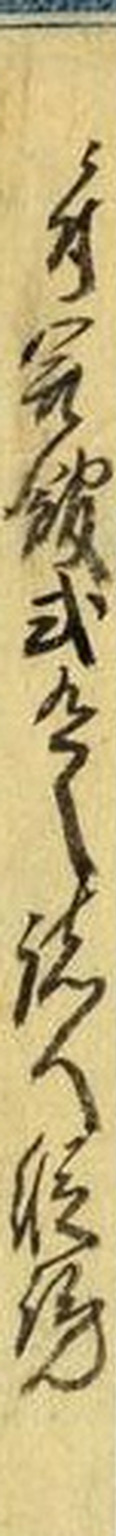に付開館式有之諸人縦覧
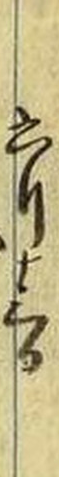六月十三日
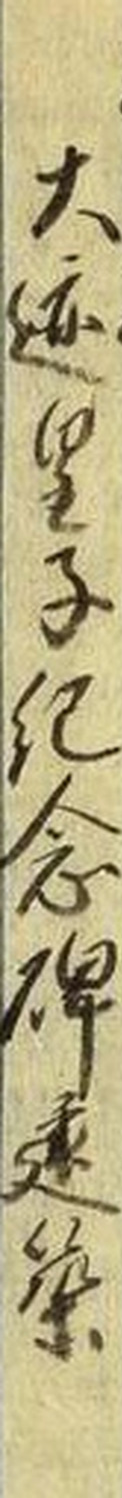大迹皇子紀念碑建築
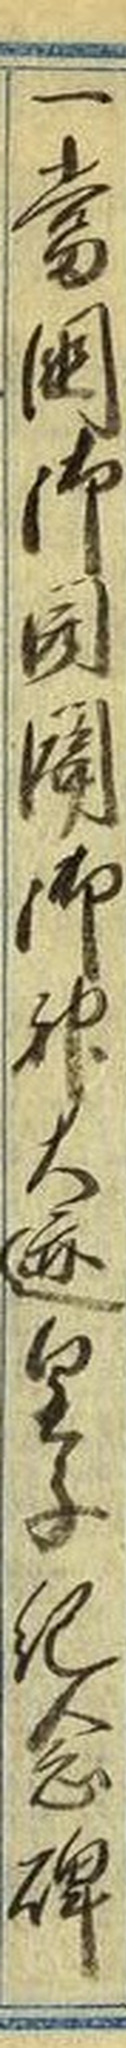一当国御開闢御神大迹皇子紀念碑
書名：温古集 五巻
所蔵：福井県文書館 Fukui Prefectural Archives
